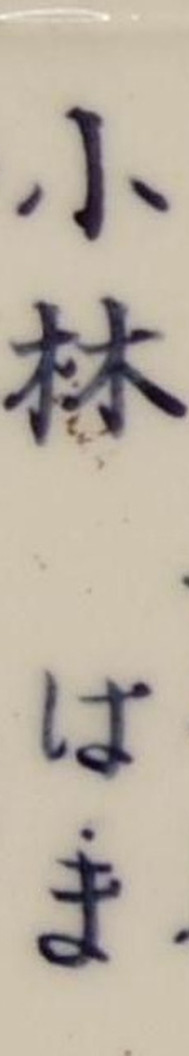小林はま
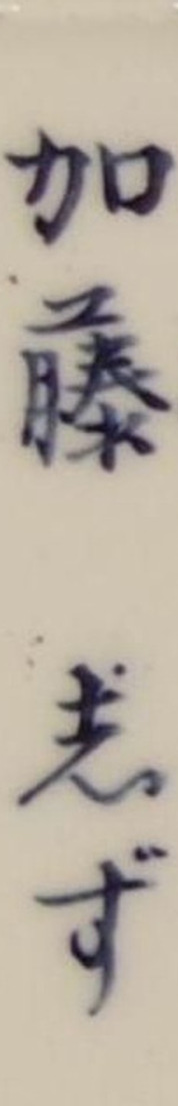加藤しず
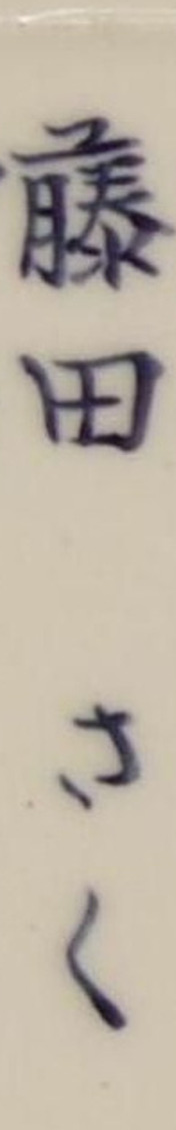藤田さく

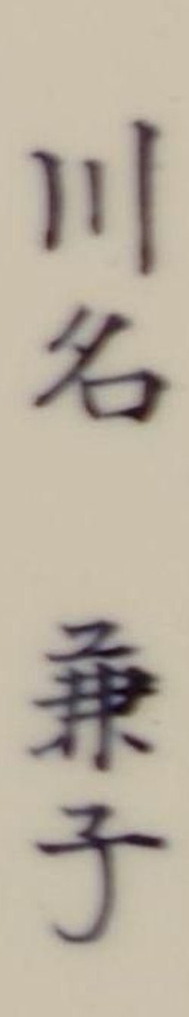川名兼子
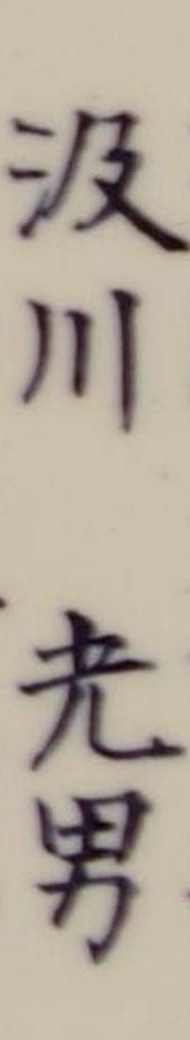汲川光男
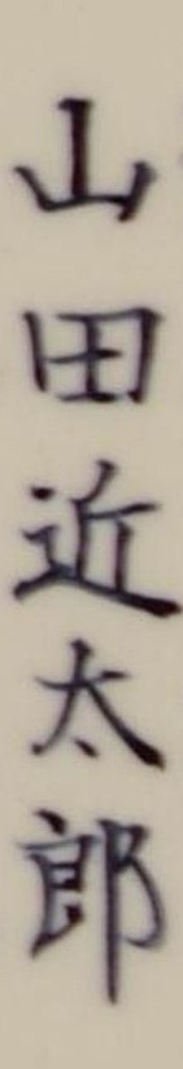山田近太郎
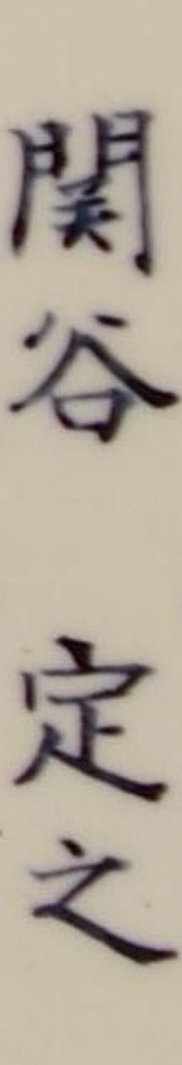関谷定之
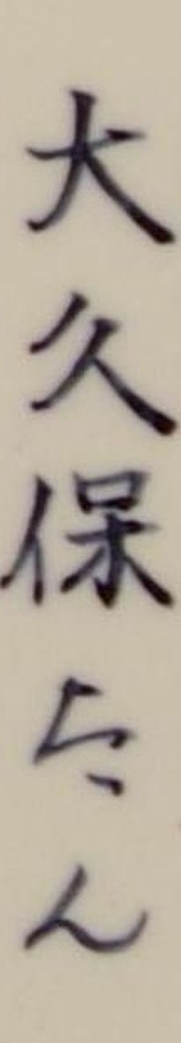大久保たん
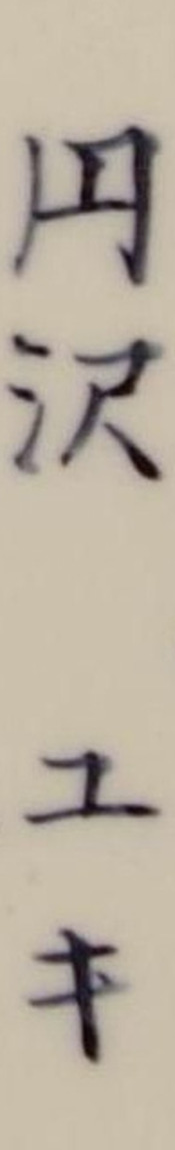円沢ユキ
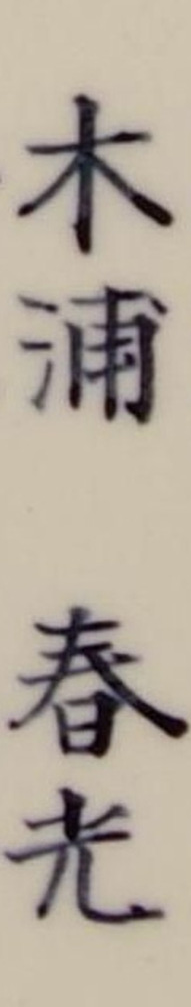木浦春光
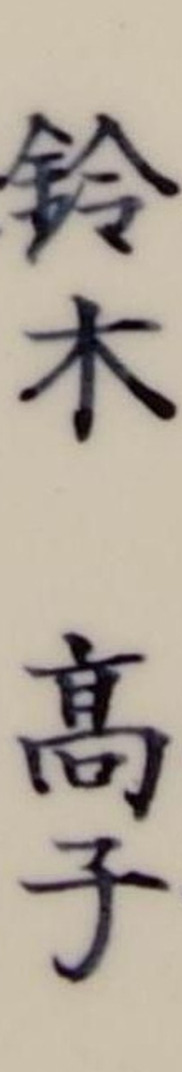鈴木高子
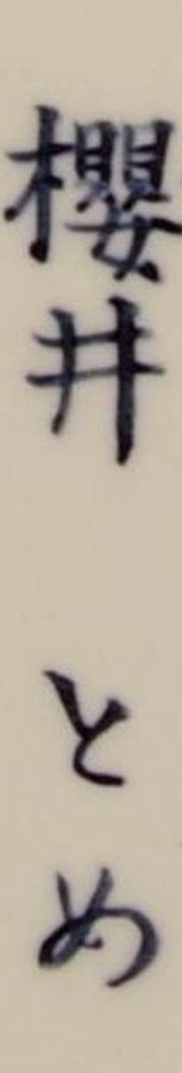桜井とめ
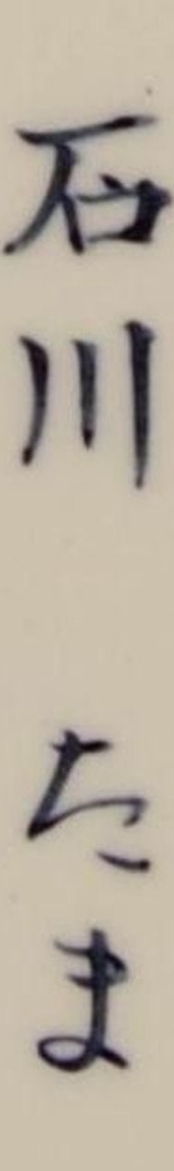石川たま
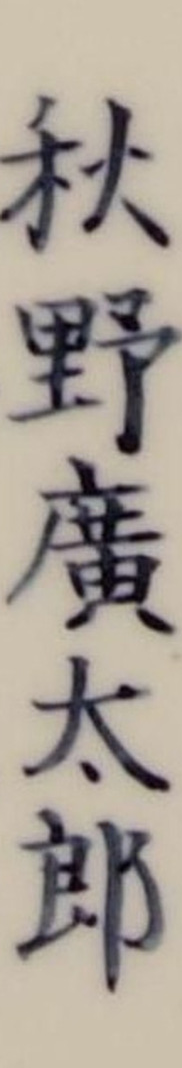秋野廣太郎
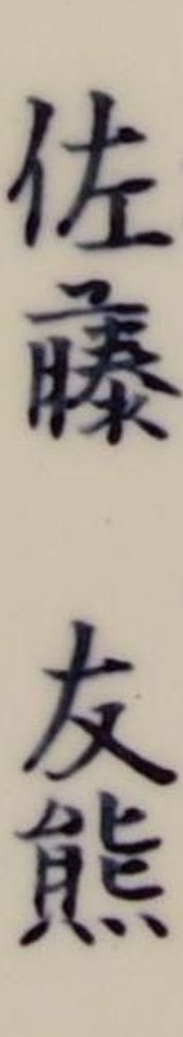佐藤友熊
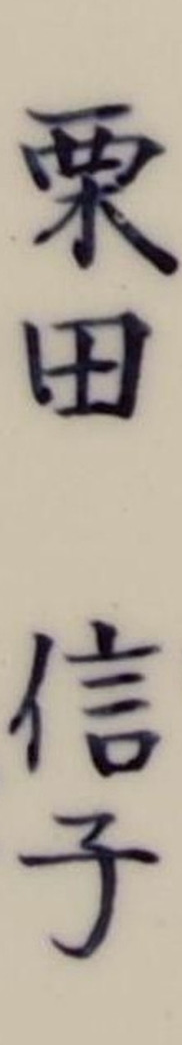栗田信子
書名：M~S
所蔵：高野山金剛峯寺
